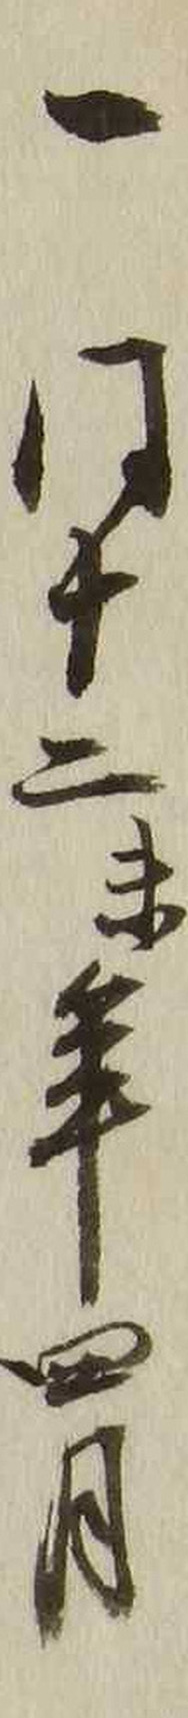一同十二未年四月
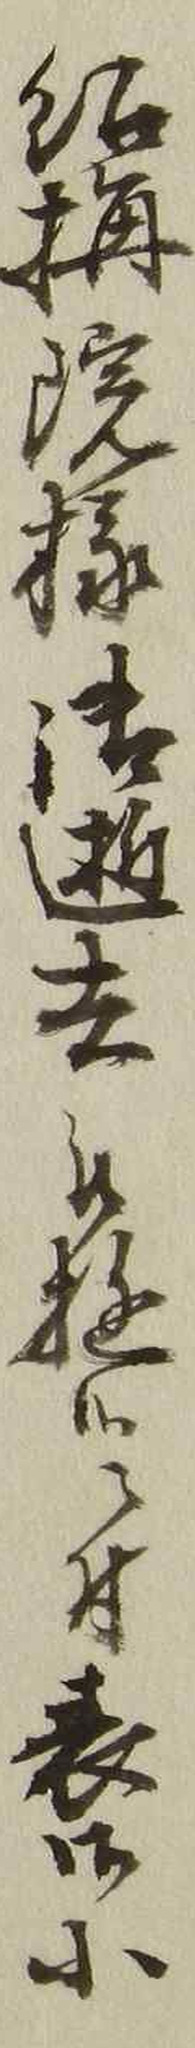紹栴院様御逝去被遊候ニ付表御小
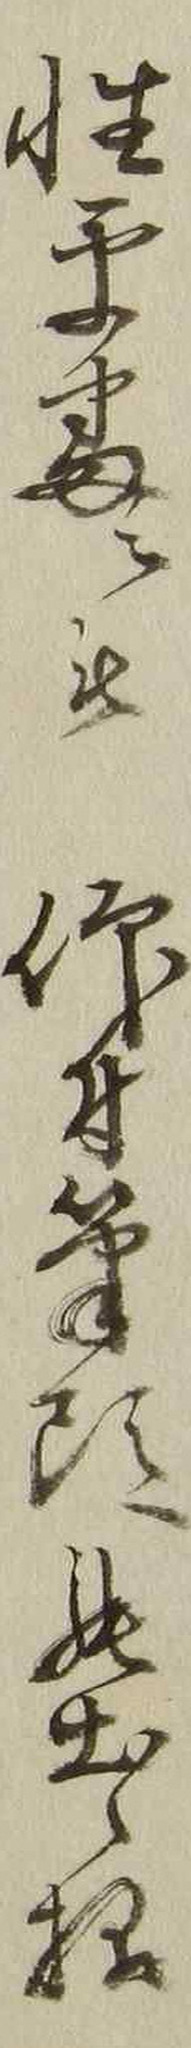性平番ニ被仰付筆頭へ罷出候様
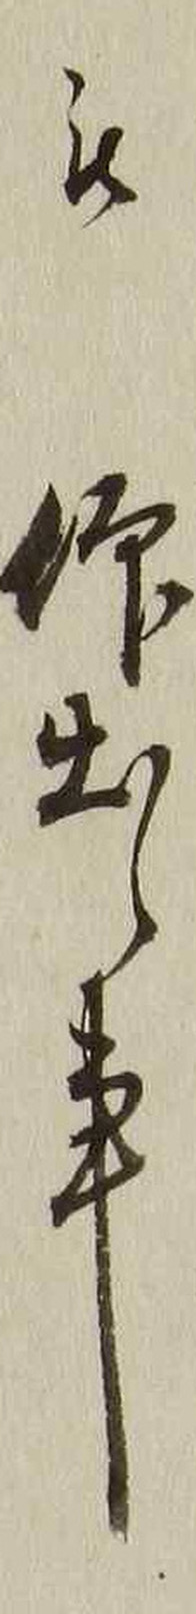被仰出候事
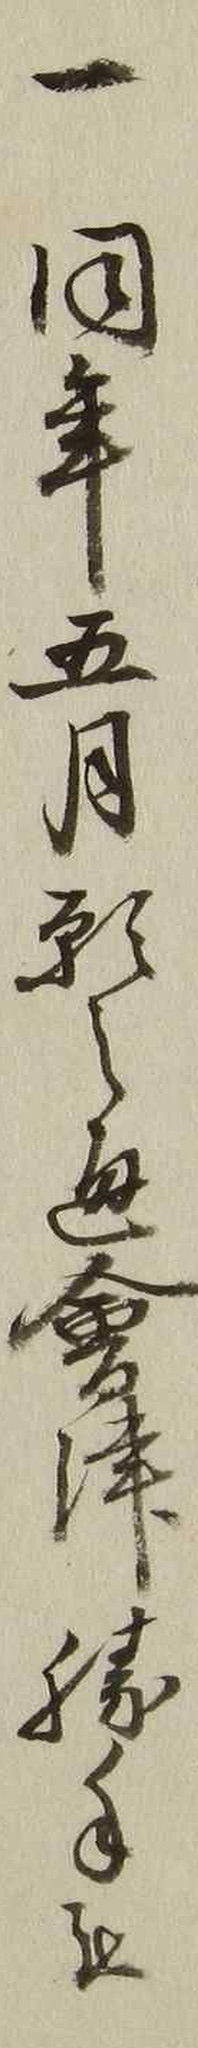一同年五月願之通会津勝手被
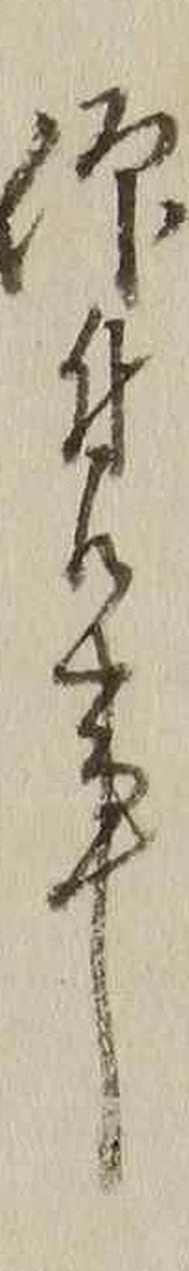仰付候事
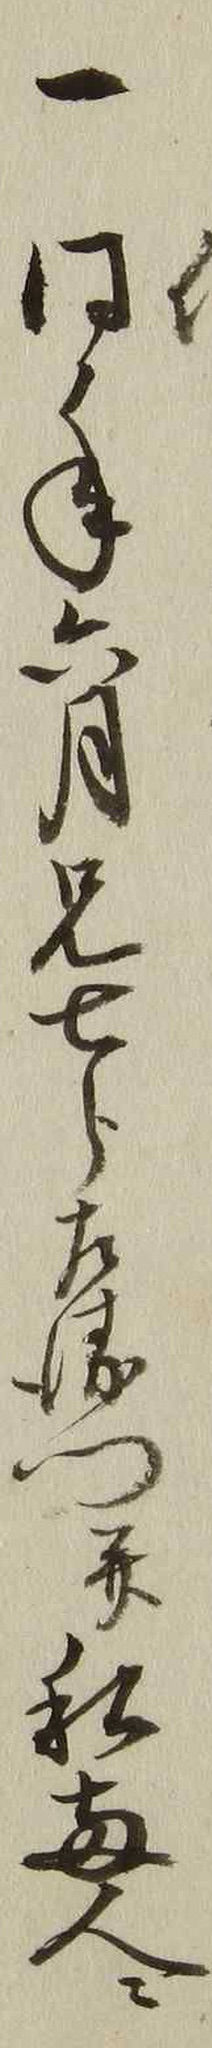一同年六月兄七郎左衛門并私両人ニ
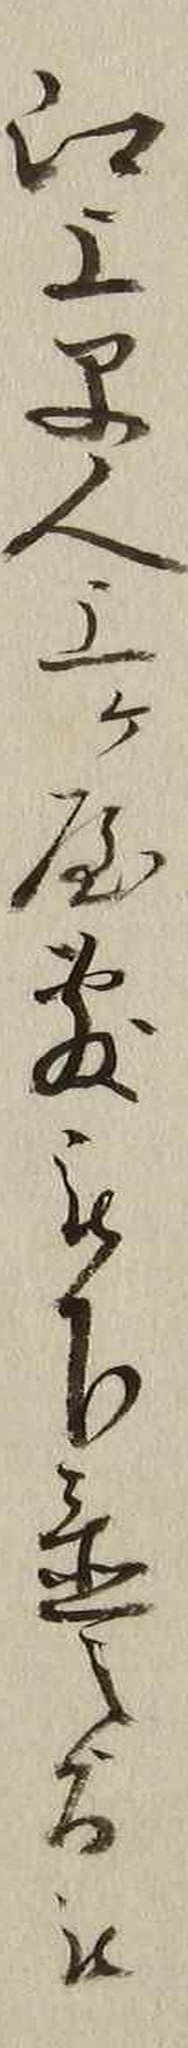江上早人上ケ屋敷被下置之旨被候
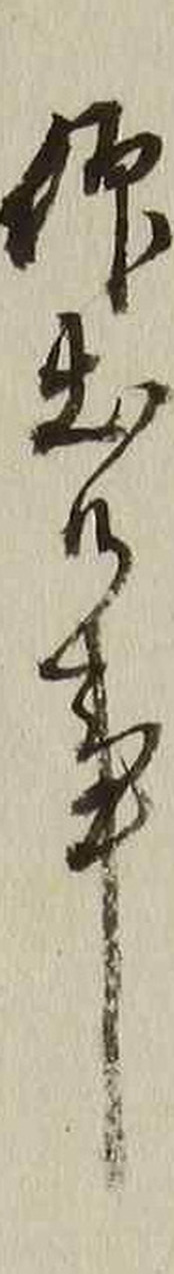仰出候事
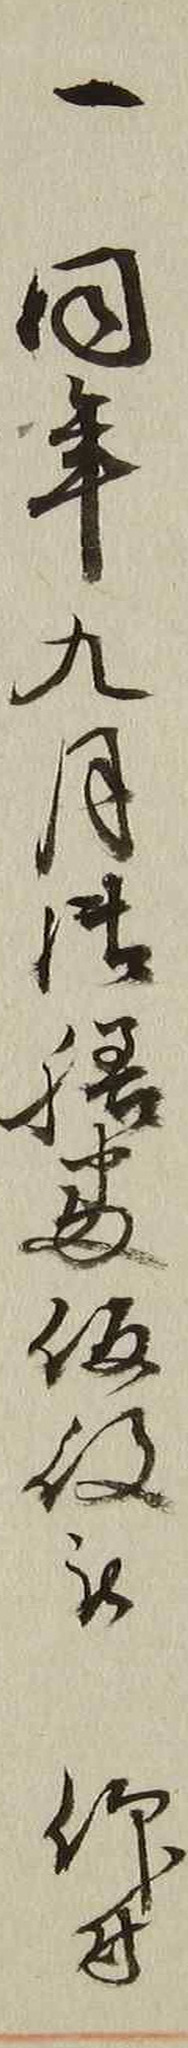一同年九月御膳番仮役被仰付
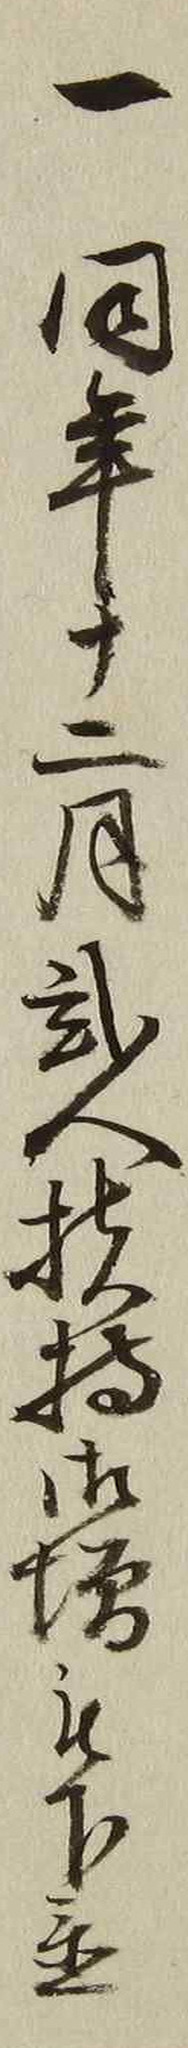一同年十二月弐人扶持御増被下置
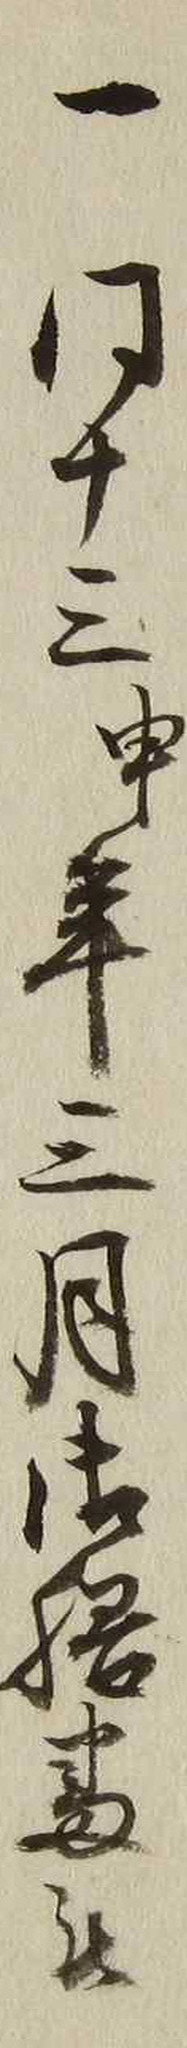一同十三申年三月御膳番被
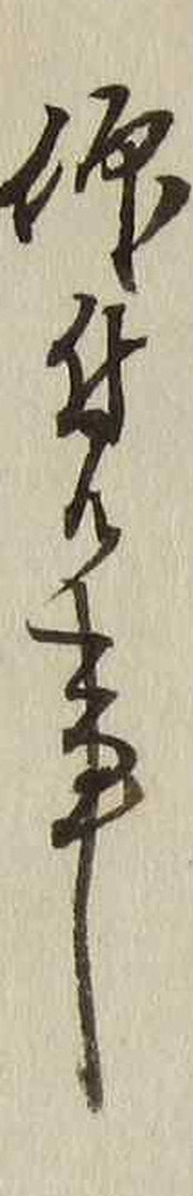仰付候事
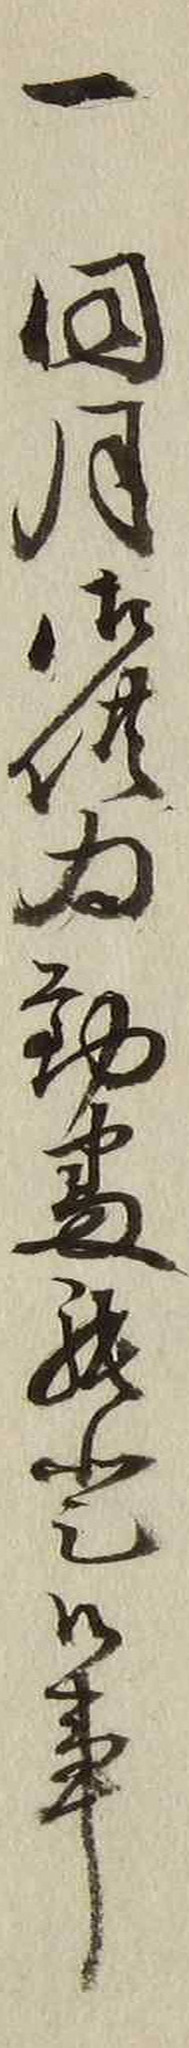一同月御供為勤番罷登候事
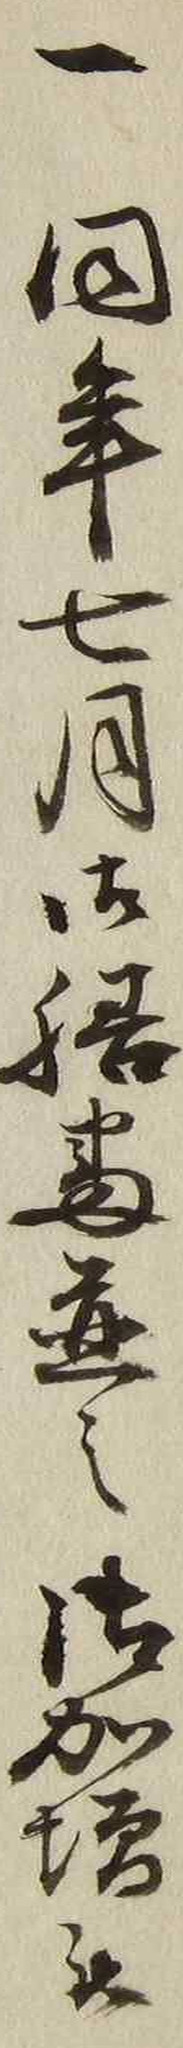一同年七月御膳番並之御加増被
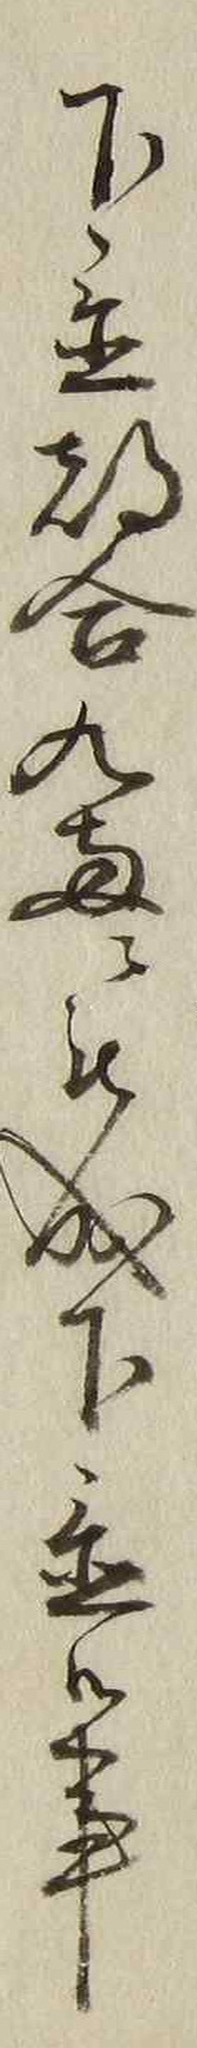下置都合九両ニ被成下置候事
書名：諸士系譜　巻之23　い之部23
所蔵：会津若松市立会津図書館
